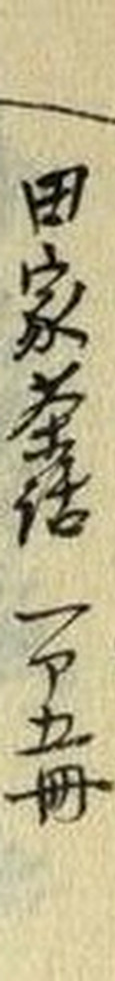田家茶話一部五冊
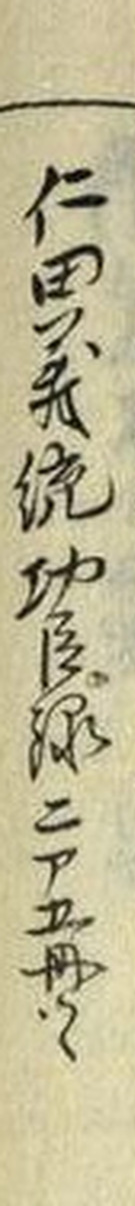仁田義統功臣録二部五冊ツヽ
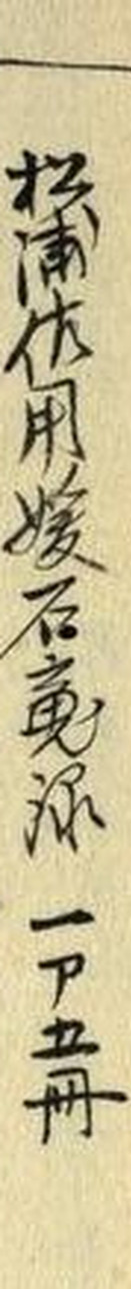松浦佐用媛石魂録一部五冊
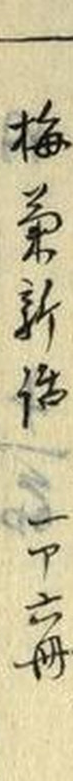梅菊新話一部六冊
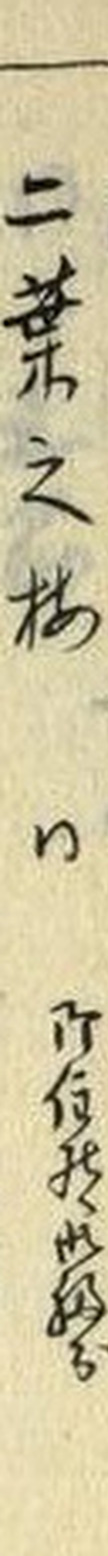二葉之梅同御住居へ御移分
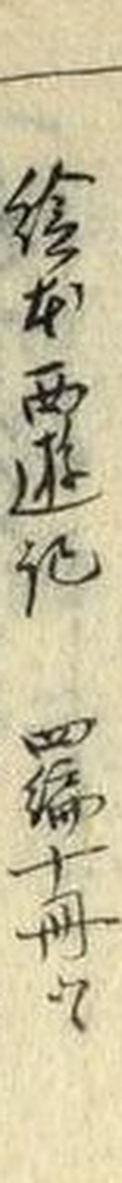絵本西遊記四編十冊ツヽ
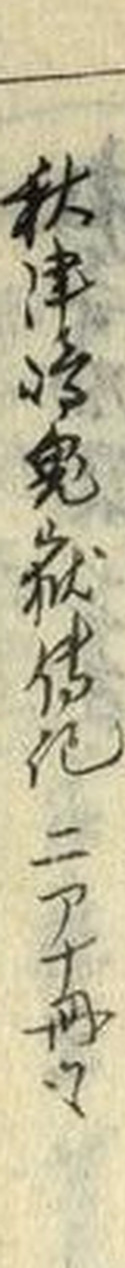秋津嶋鬼嶽伝記二部十冊ツヽ
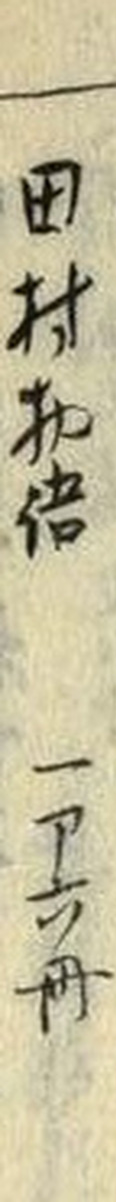田村物語一部六冊
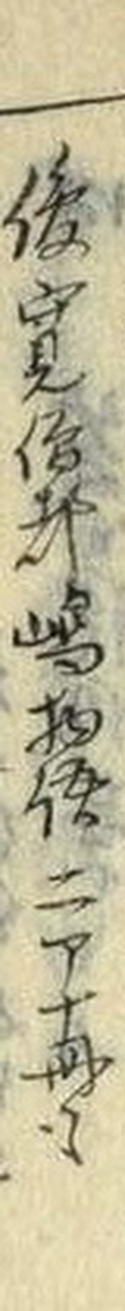俊寛僧都嶋物語二部十冊ツヽ
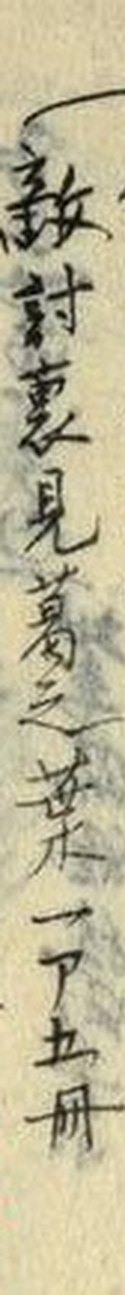敵討裏見葛之葉一部五冊

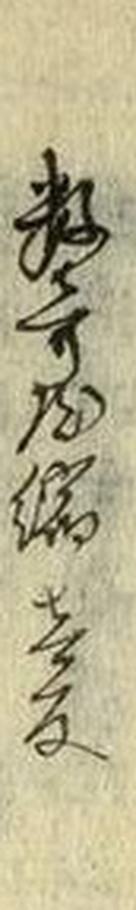数寄屋縮壱反藤田
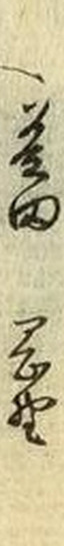藤田岡野
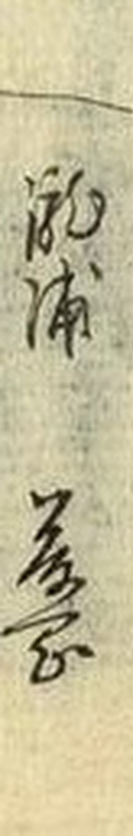滝浦藤岡
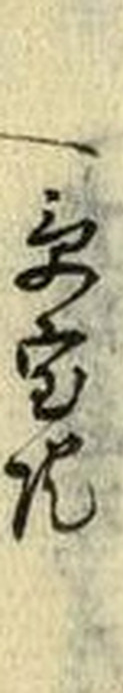受宝院
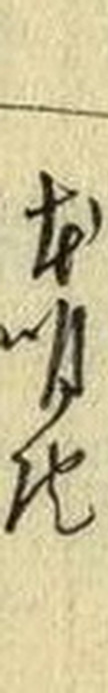本明院
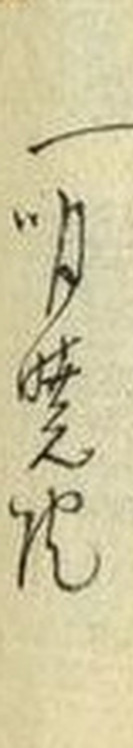明暁院
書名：少傅日録抄（斉善付側向頭取日記、江戸并道中、初入在国、逝去後…
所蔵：福井県文書館 Fukui Prefectural Archives
